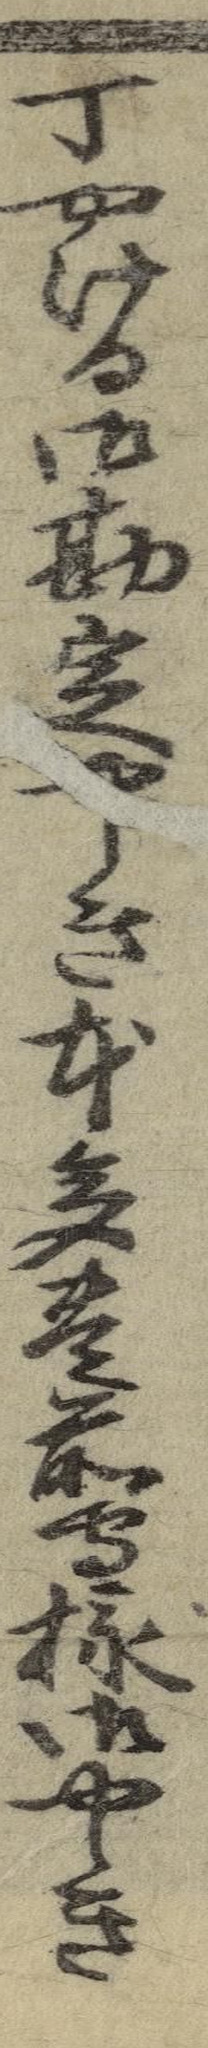丁やける御勘定やしき本多豊前守様御やしき
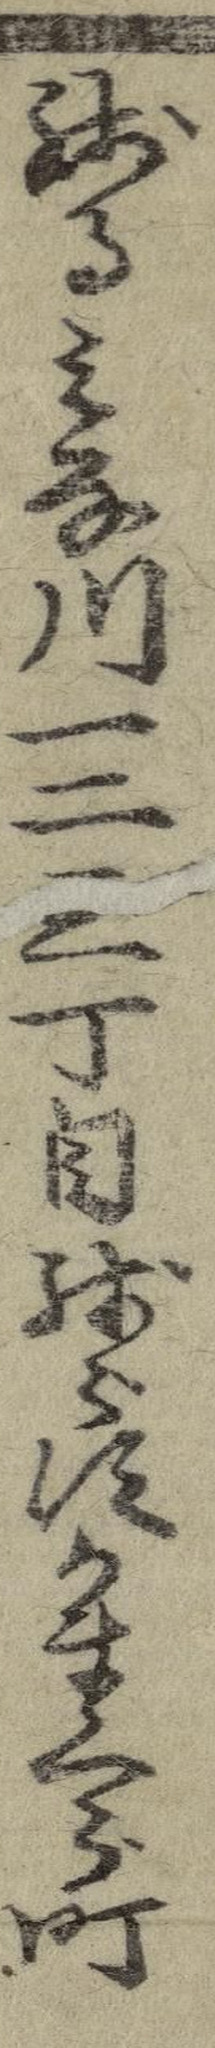残るみな川一二三丁目残らすかまくら町
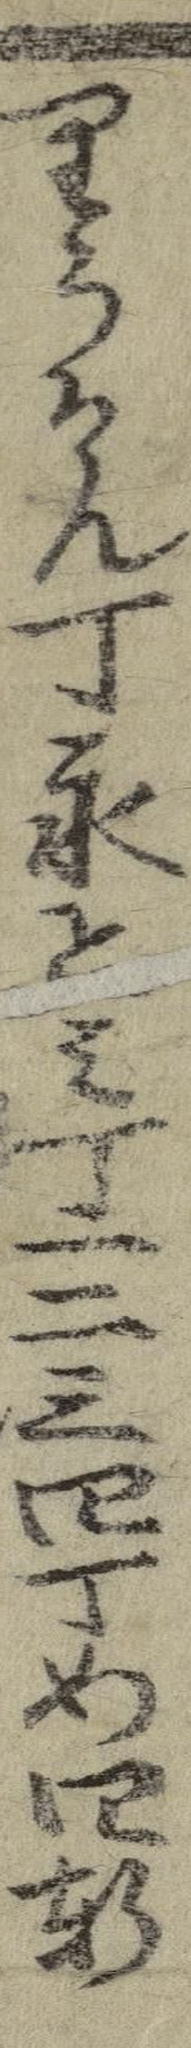りうかん丁永とみ丁一二三四丁め四軒
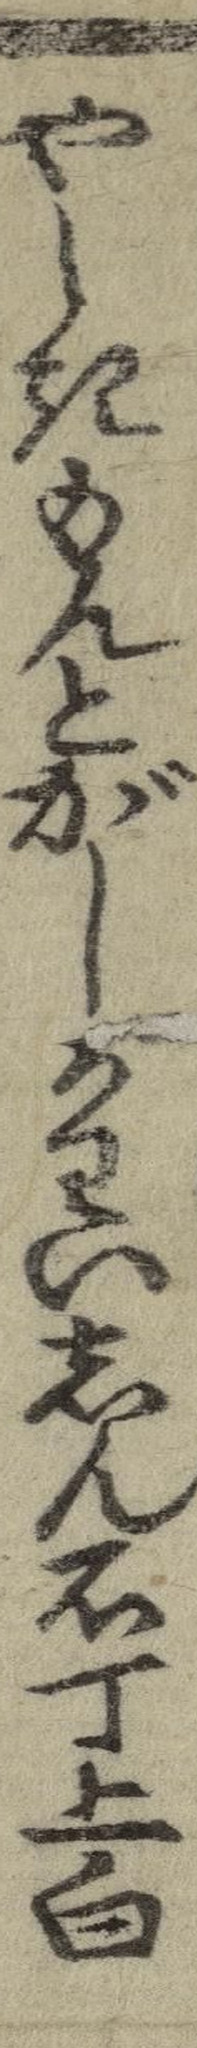やしきもんとがしかわはしん石丁上白
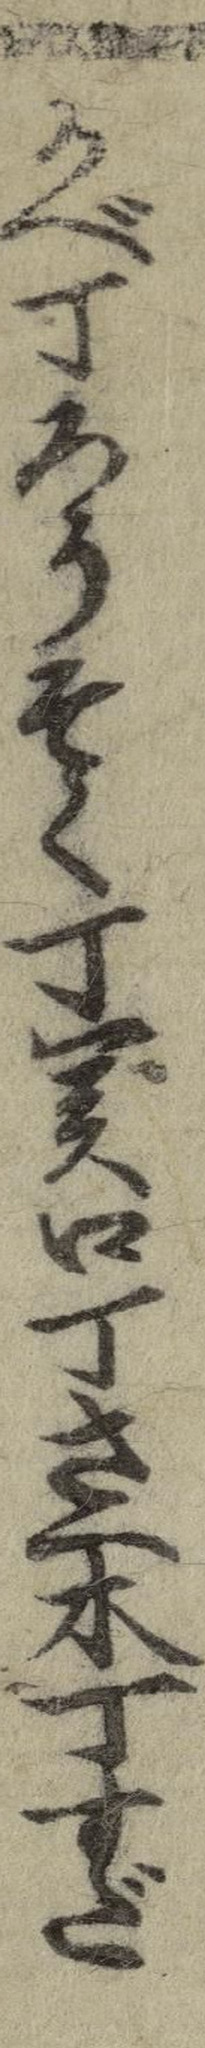かべ丁ろうそく丁実口丁さへ木丁すだ
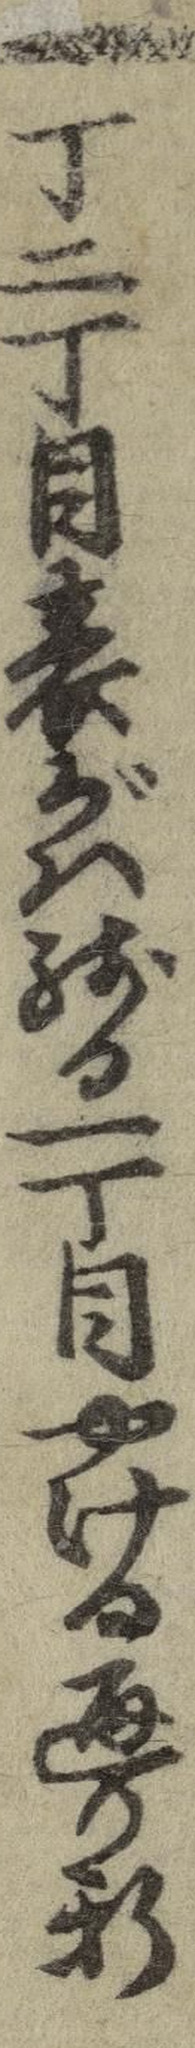丁二丁目表がは残る一丁目やける通り軒
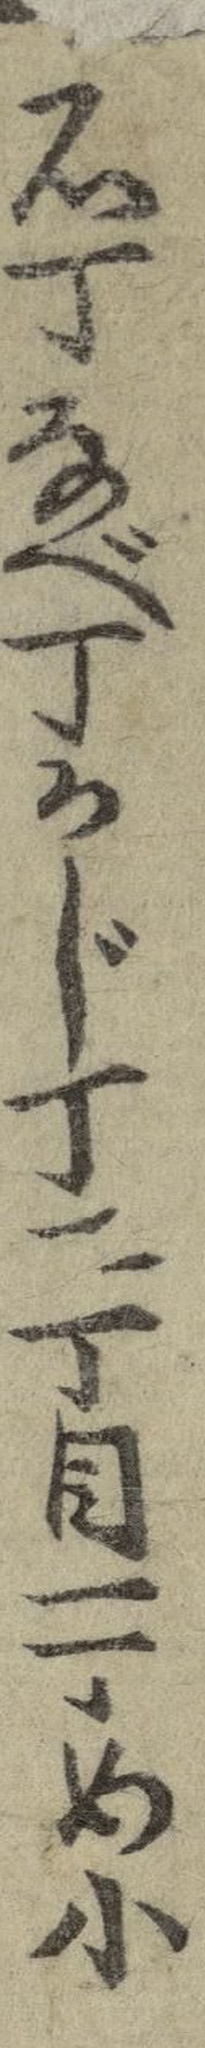石丁なべ丁ろじ丁二丁目一丁め小
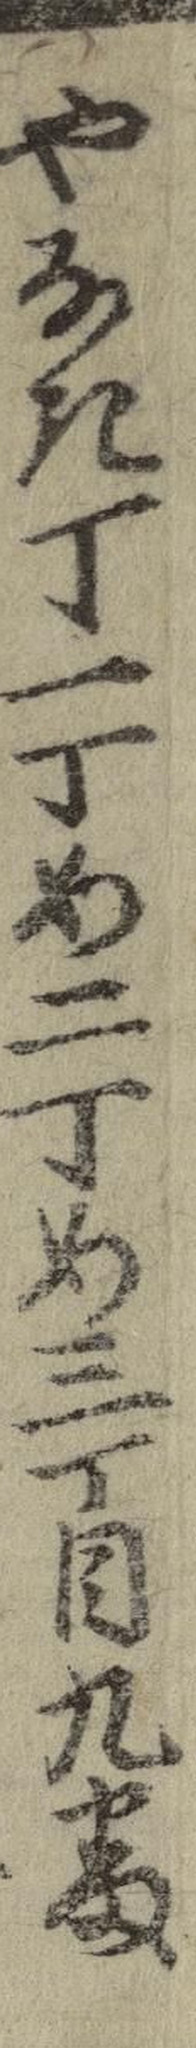やなき丁一丁め二丁め三丁目九番
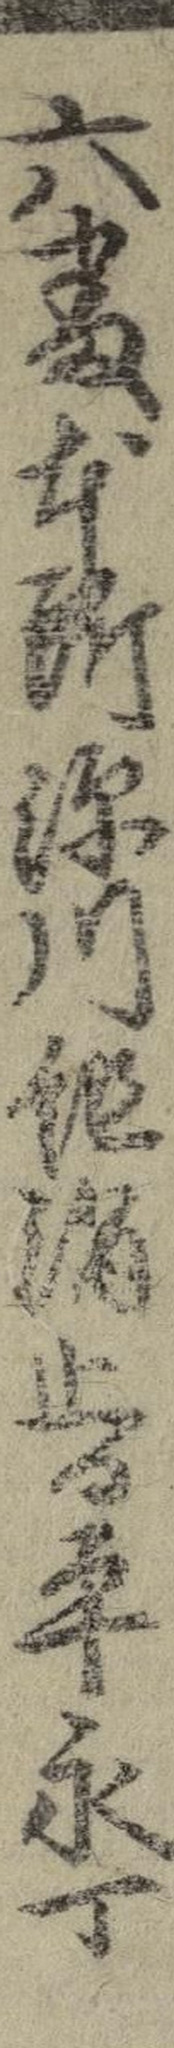六番本所深川組消止る半永丁
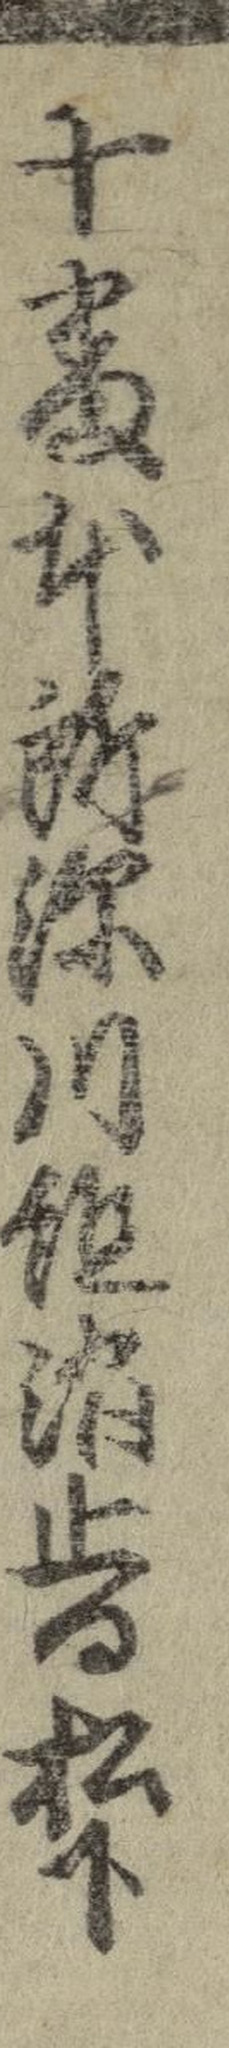十番本所深川組消止る松下
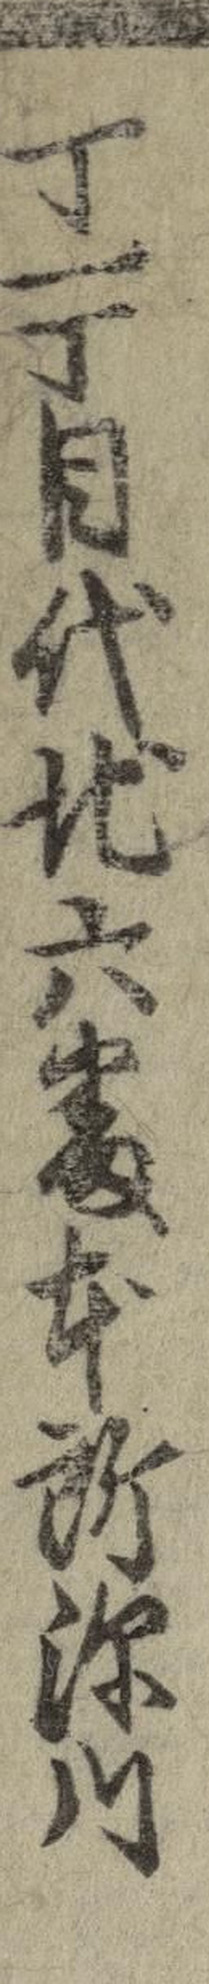一丁目代地六番本所深川
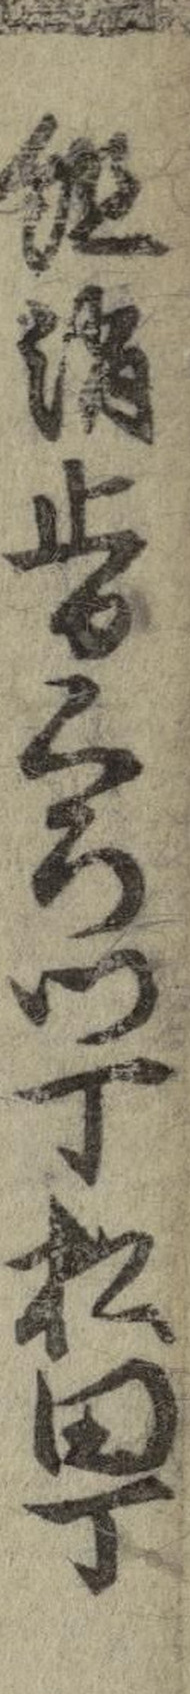組消止るくろつ丁松田丁
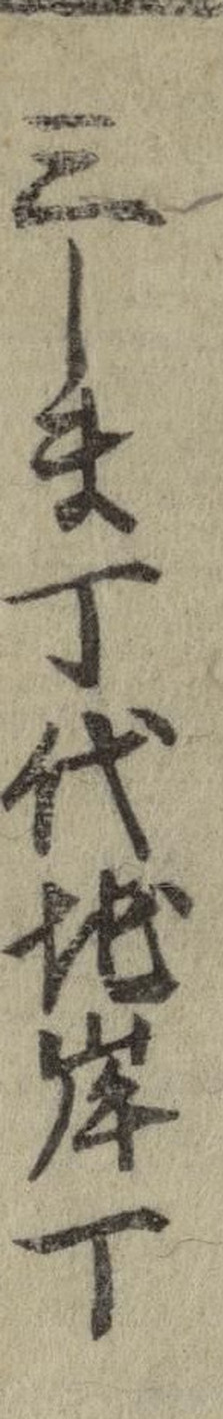三しま丁代地岸丁
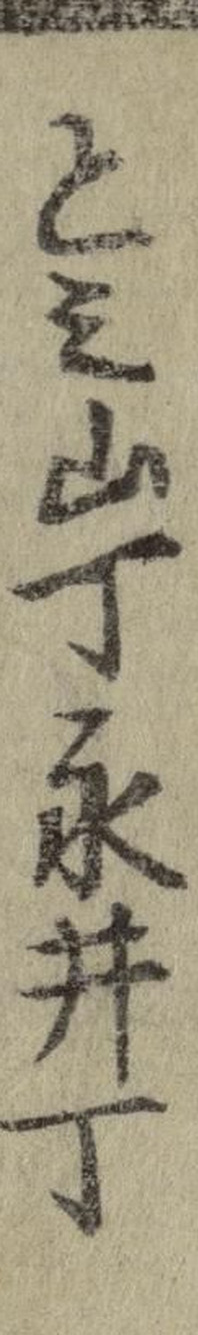とみ山丁永井丁
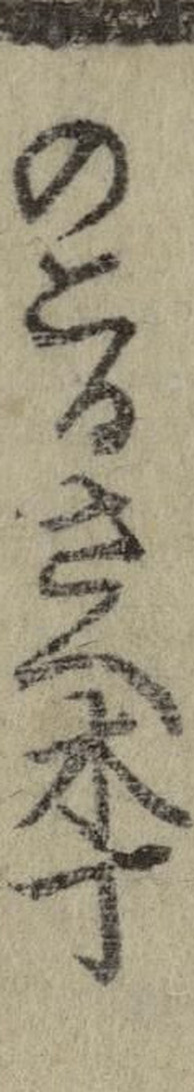のこるさへ木丁
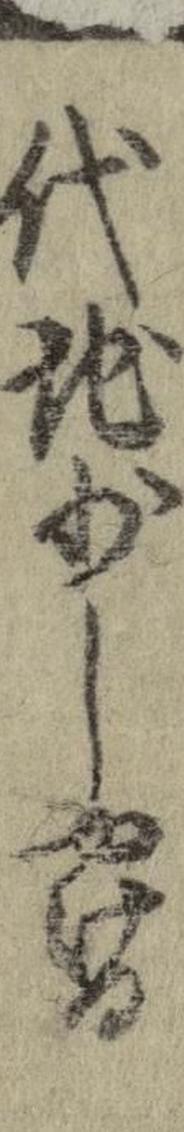代地少しやける
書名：[安政元年十二月の江戸大火に関する瓦版]
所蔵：東京大学地震研究所図書室 Earthquake Research Institute Library, The University of Tokyo, JAPAN
